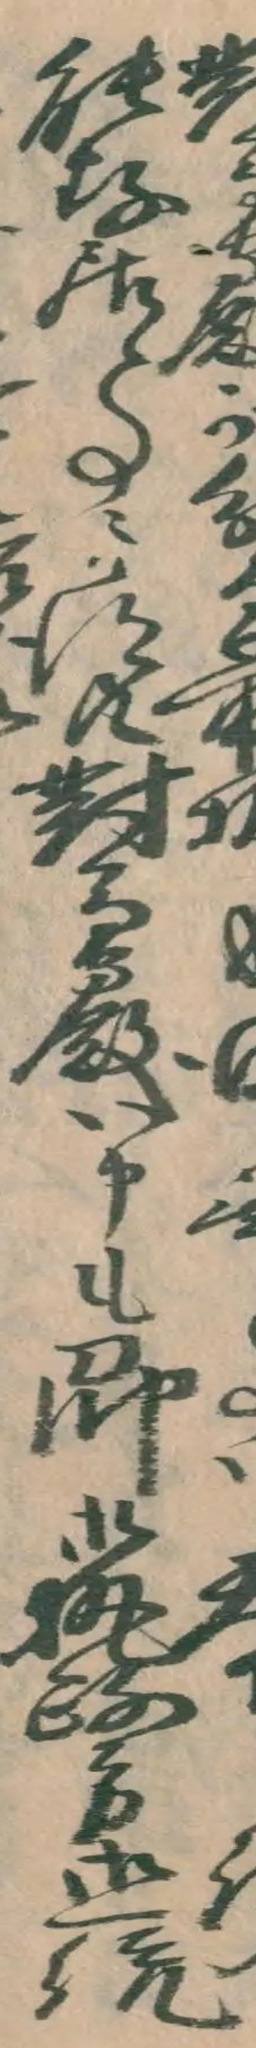能存居候事ニ候得共對馬守殿ハ申も即御執政方御一統
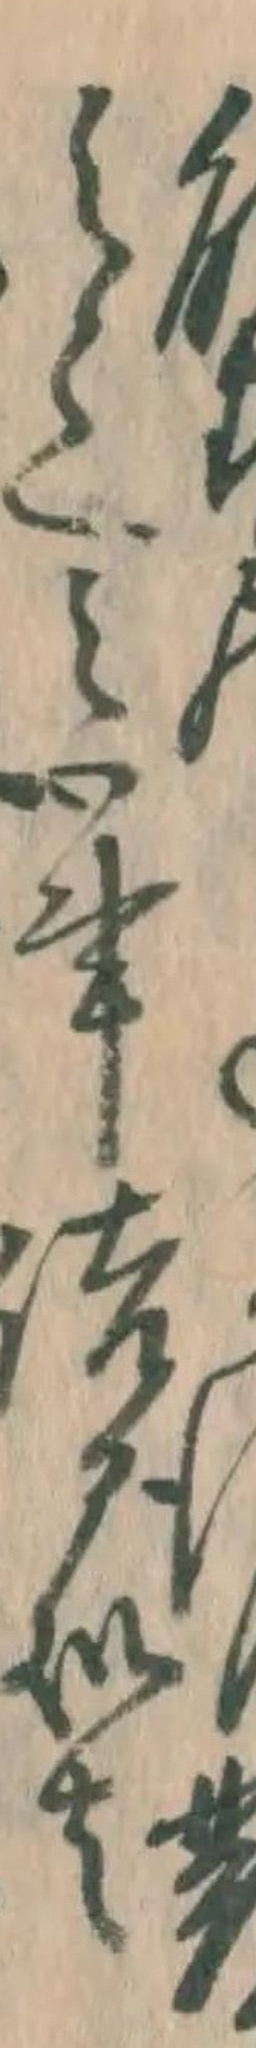之上之御事詰る処者
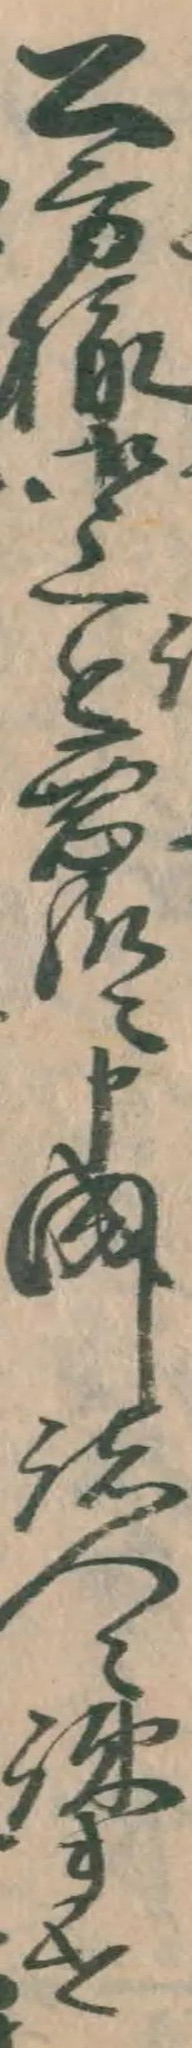公方様御上を悪様ニ申成し諸人ニ疎ませ
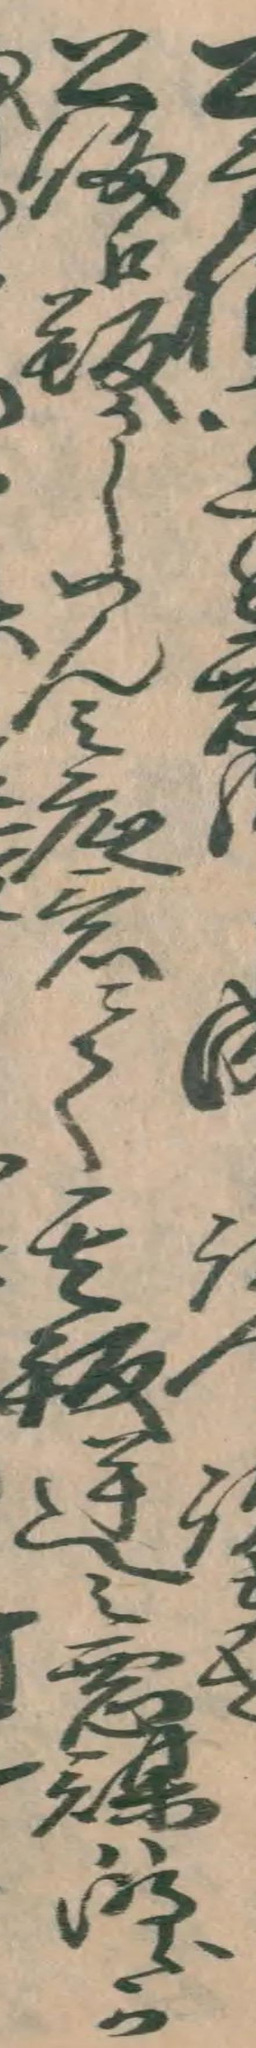公儀江叛かしめん之底意二て其叛逆之悪謀ハ明らか
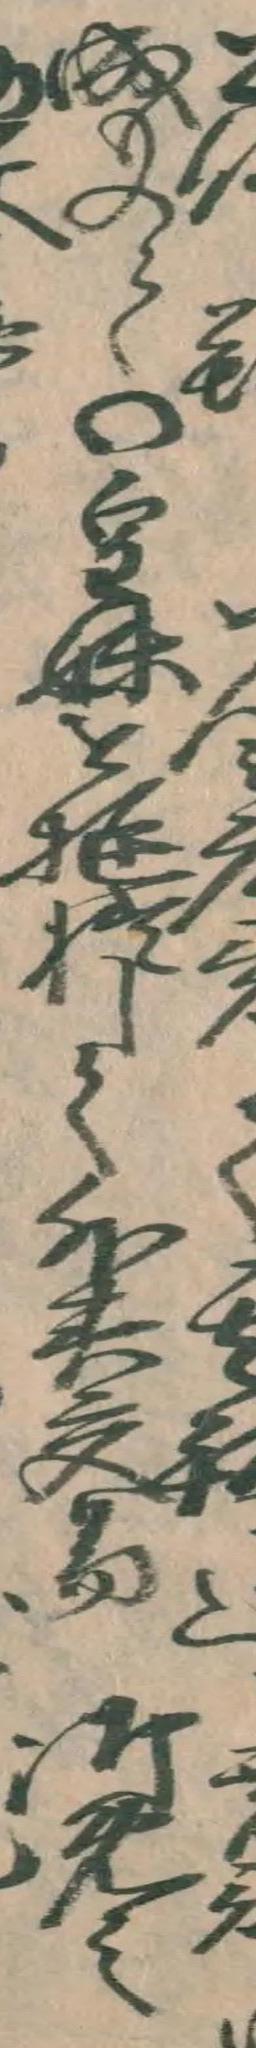成ものニ候○皇妹を樞機して外夷交易御免之
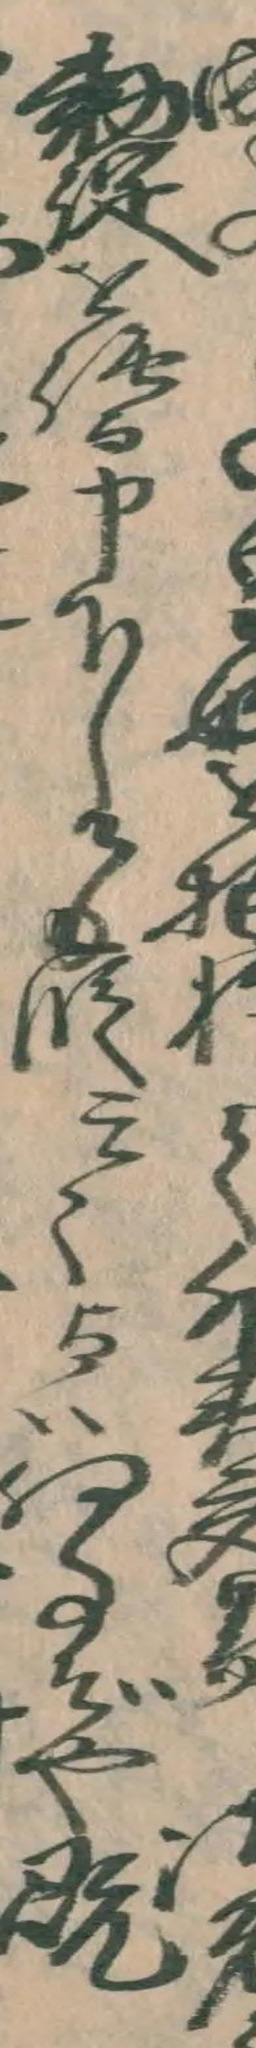勅諚を強而申下し候手段云々とハ何事ぞや既
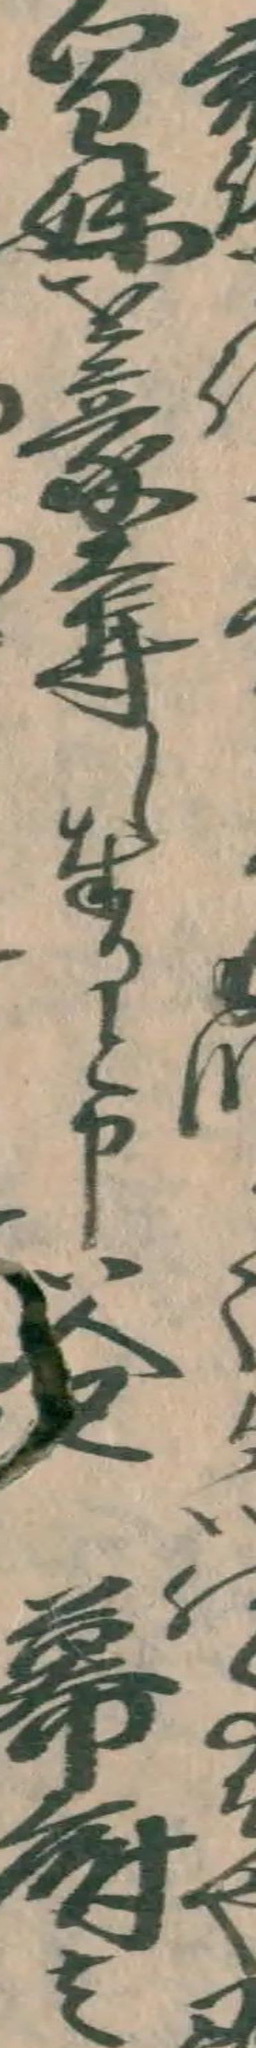皇妹を豪奪し奉りと申ハ全幕府者
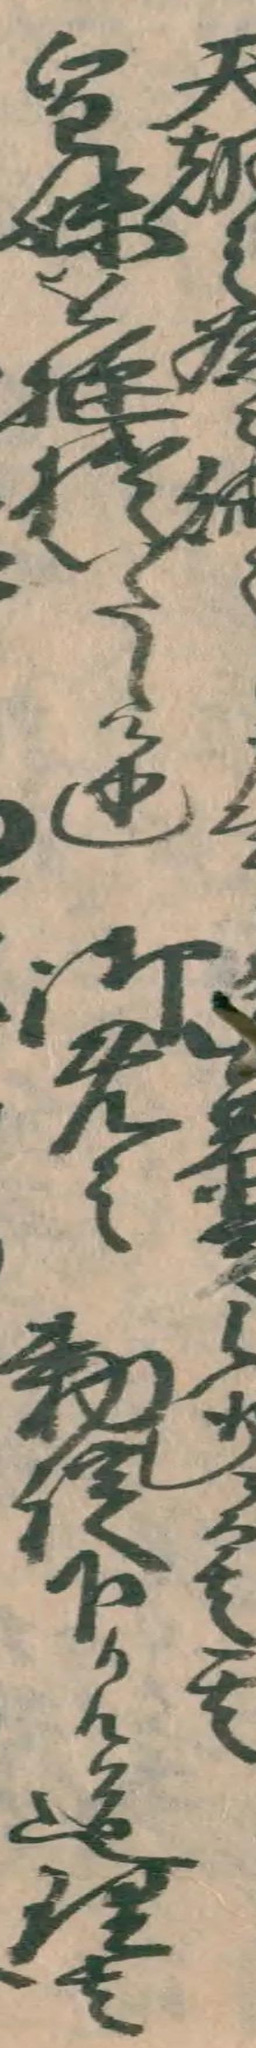皇妹を樞機いたし候迚御免之勅諚下り候道理者
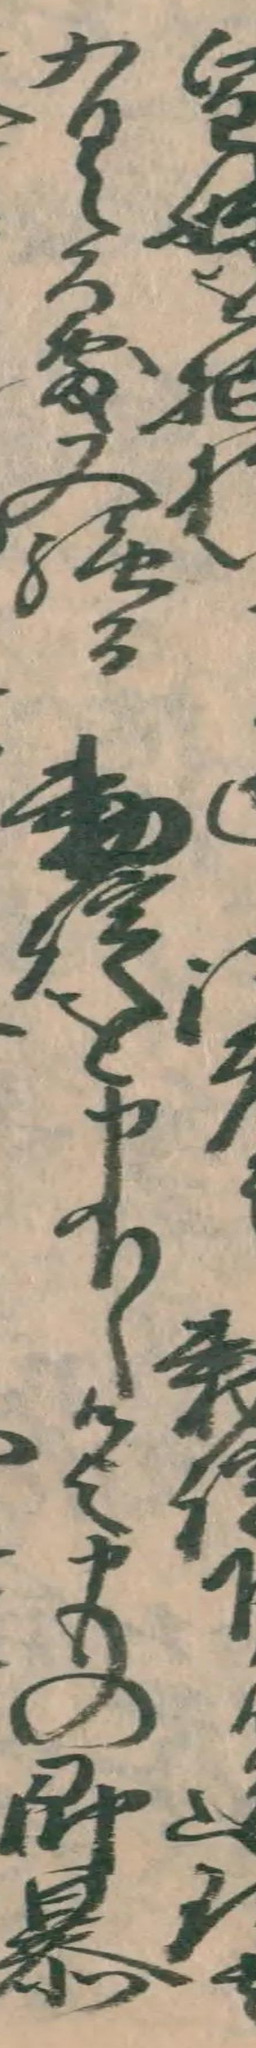有之間敷又強而勅諚を申下し候と申もの即暴
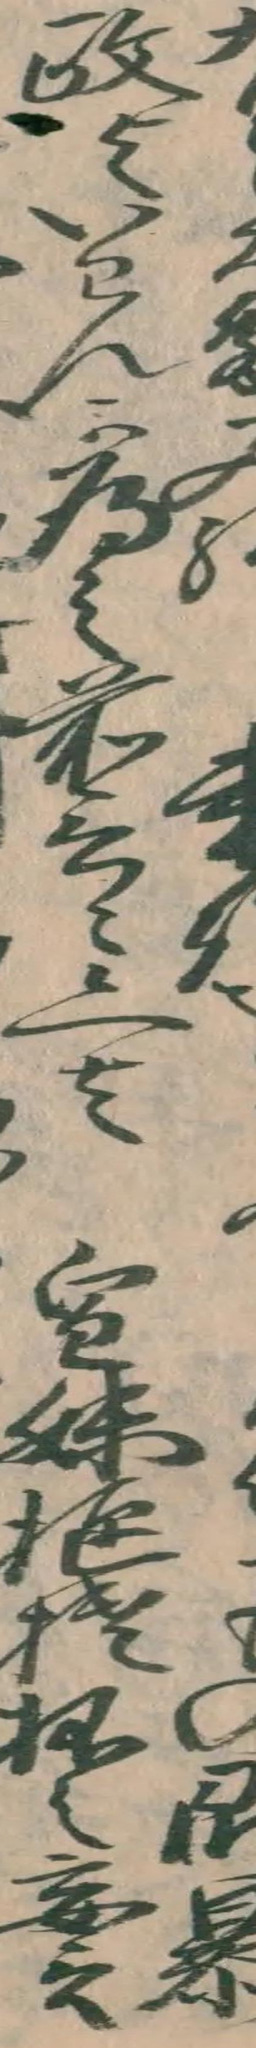政といわんか為之前言ニ候へ者皇妹樞機抔之妄言
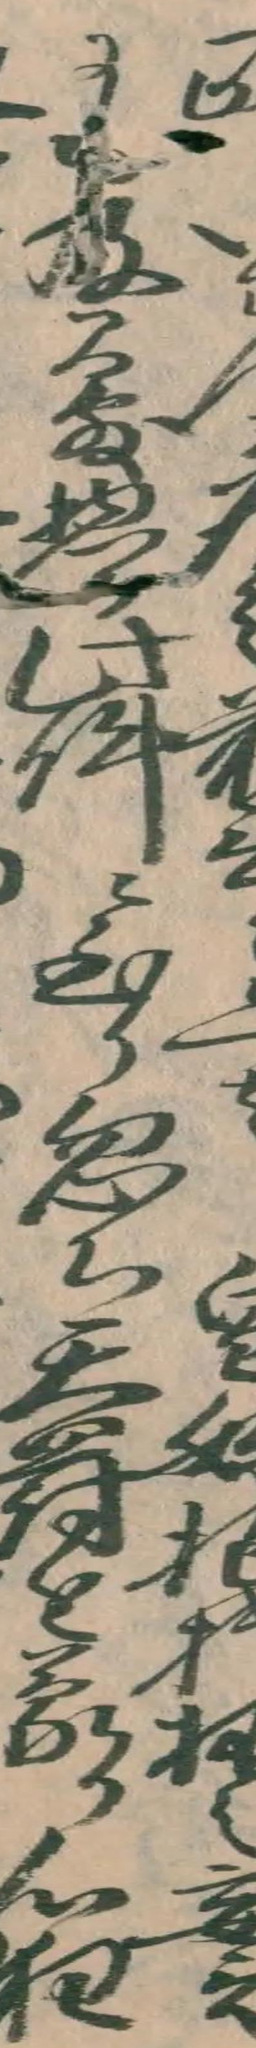にも及間敷惣テ此件ニ至り忽ち天罰を蒙り心狂
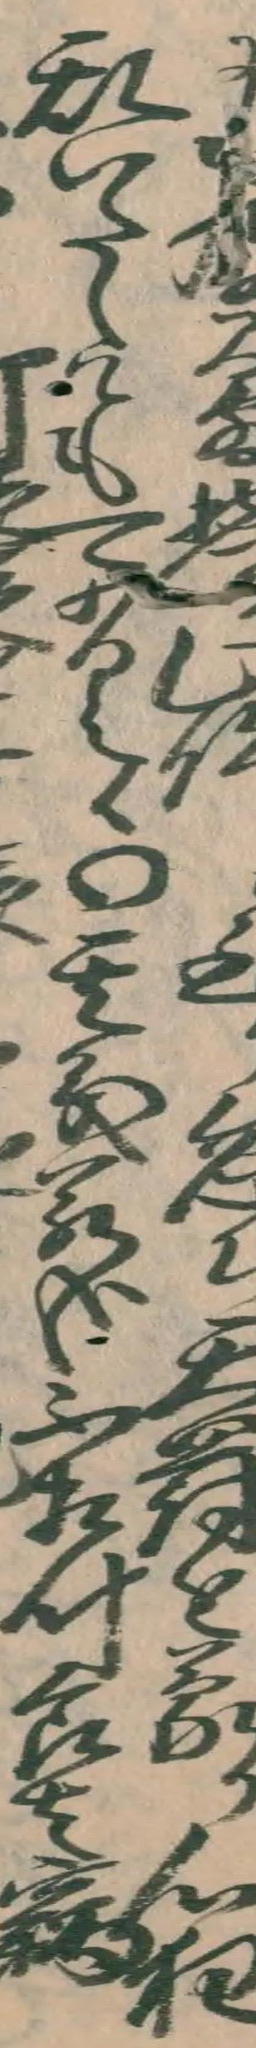乱いたし候も可有之候〇其義若哉不相叶候節者竊
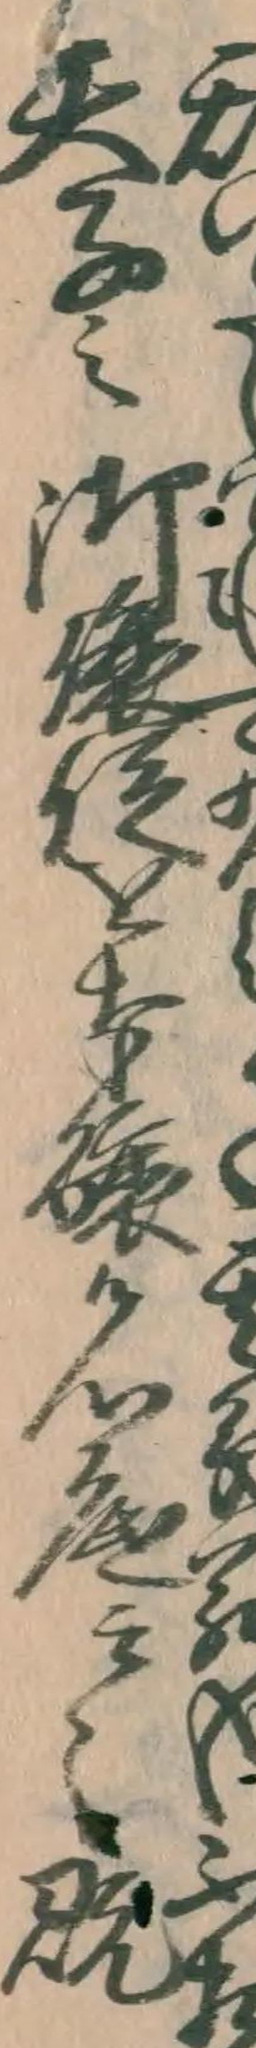天子之御譲位を奉醸候心底云々既
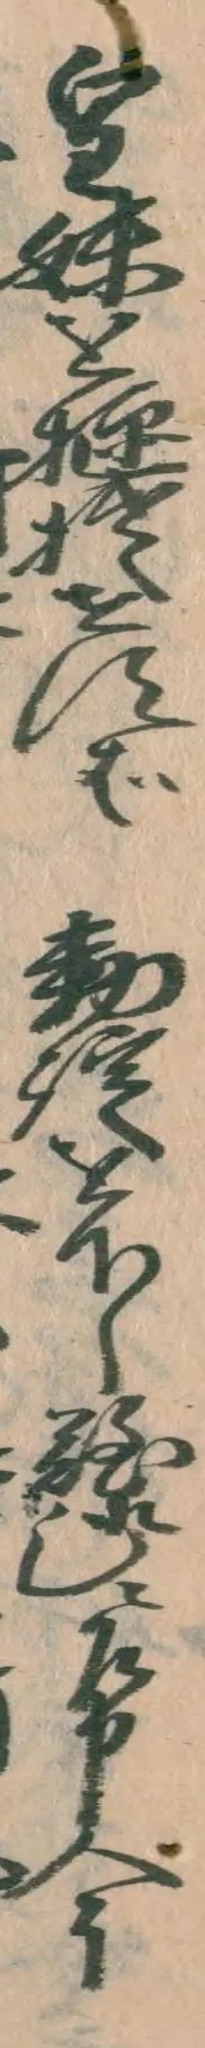皇妹を樞機せすば勅諚を下し難趣ニ乍申今
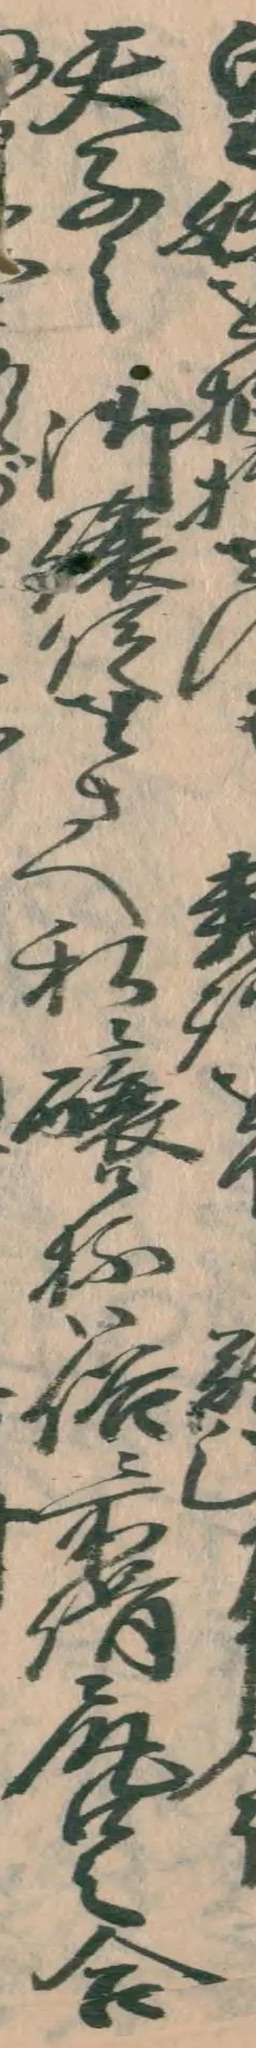天子之御譲位をさへ私ニ醸候抔ハ俗ニ所謂尻口之合
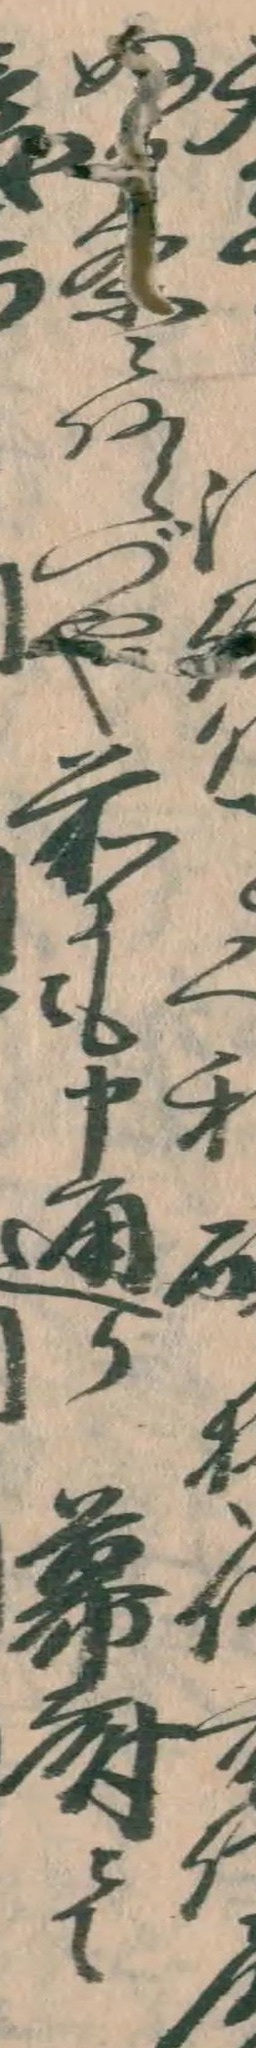ぬ申条ニあらづや前にも申通り幕府二て
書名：麗斎叢書. 20
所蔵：国立国会図書館 National Diet Library, JAPAN
